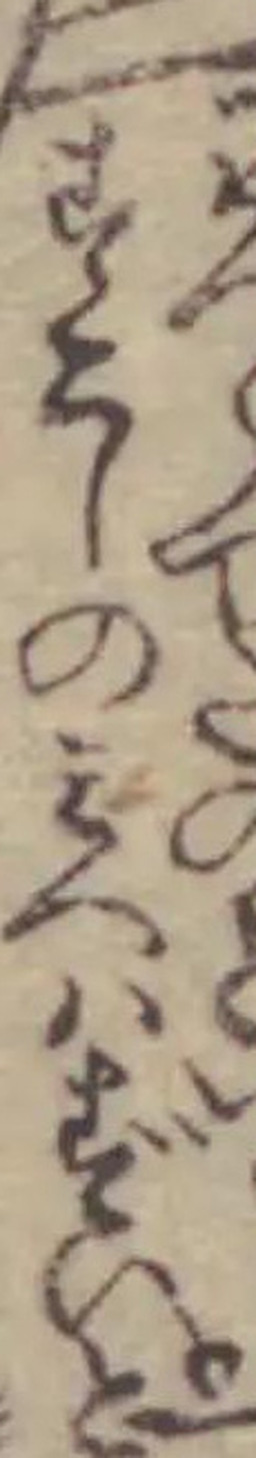すこしのみへはずいと
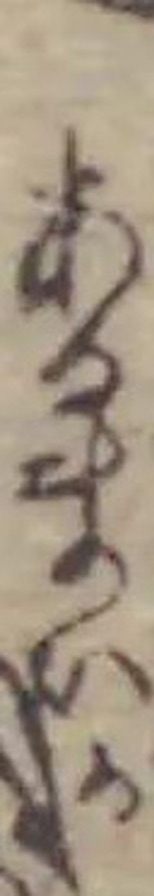あるまいが
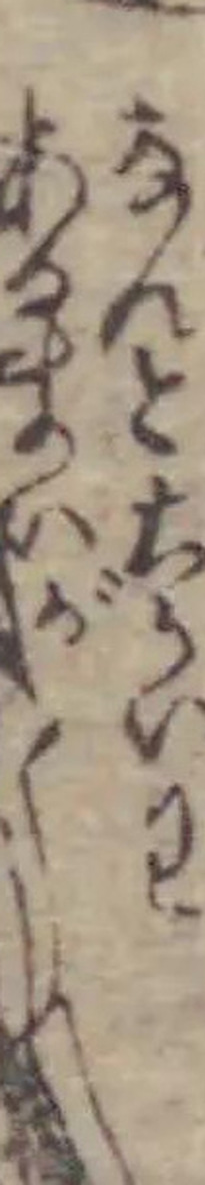あるまいが
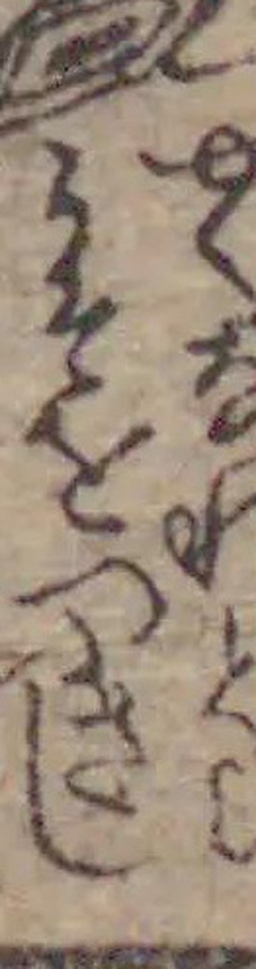うそをつきし
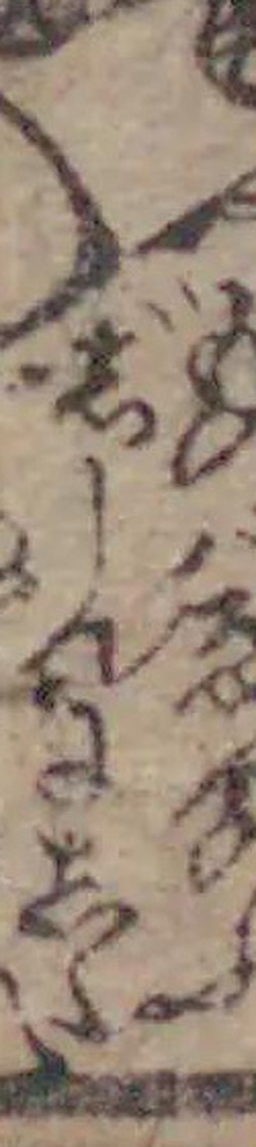じしんにした
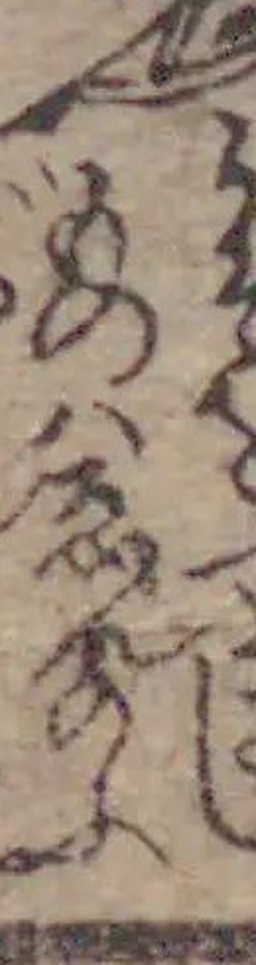ものはゑんのふ
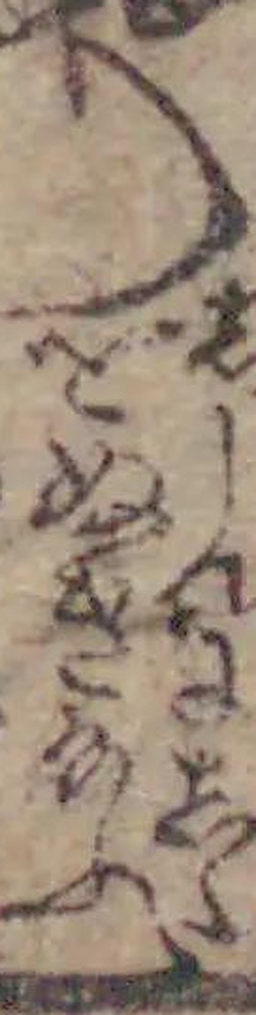をぬき給ふ
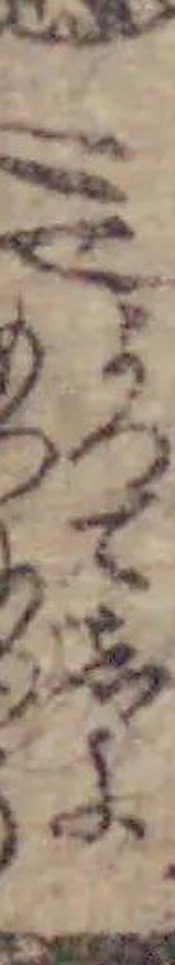よつてしよ
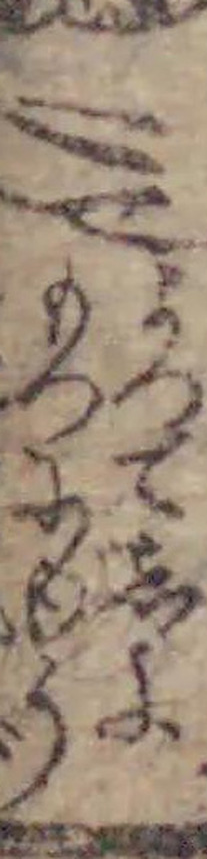もつにもう
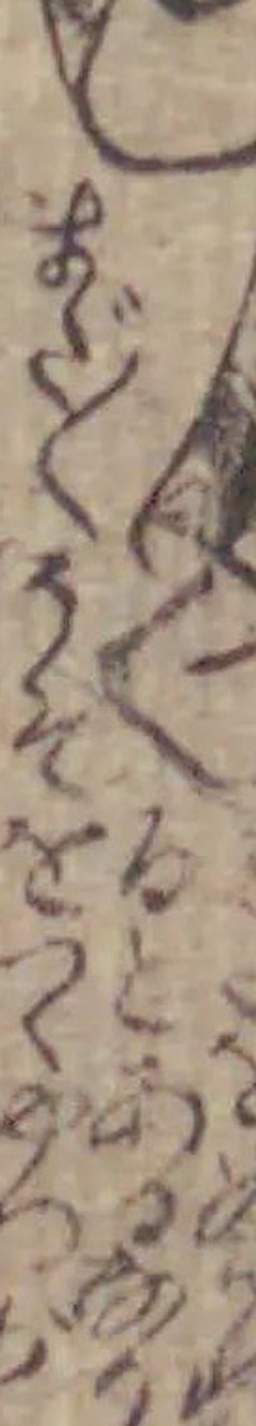まだ〳〵うそをつくやつが
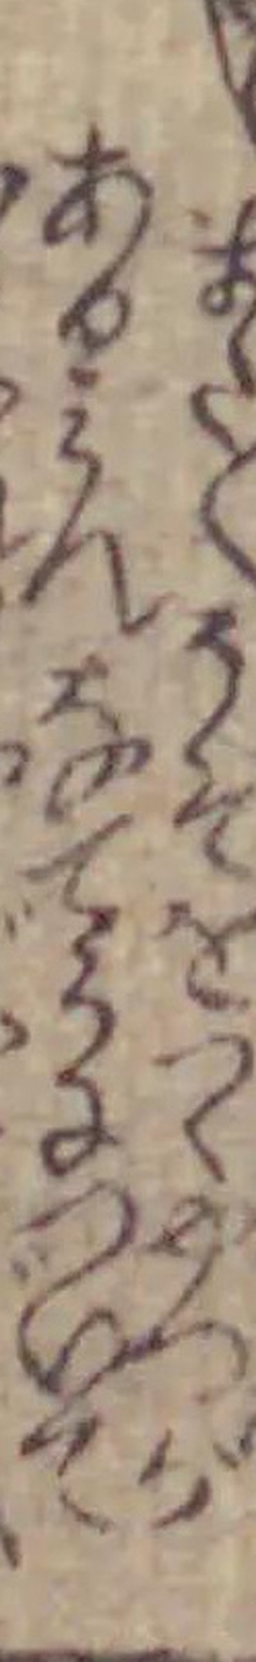あるみんなてうについて
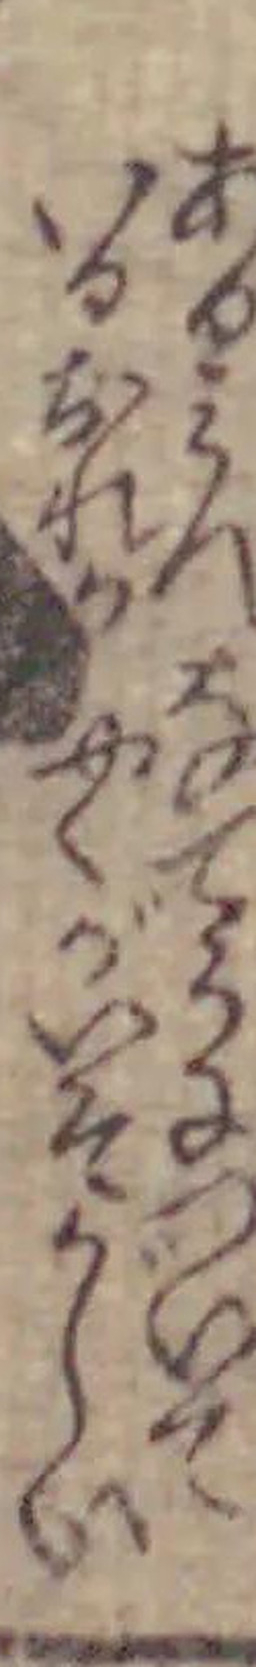いるおれかやくがいそがしい
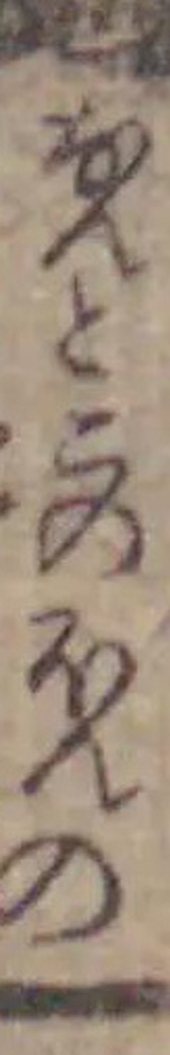なんとこのほんの
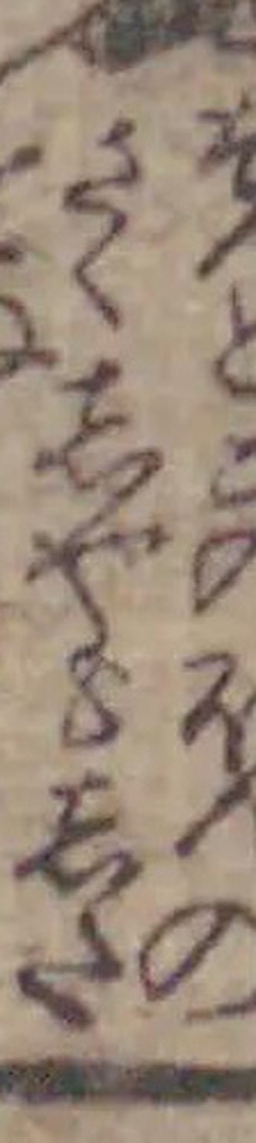さくしやもした
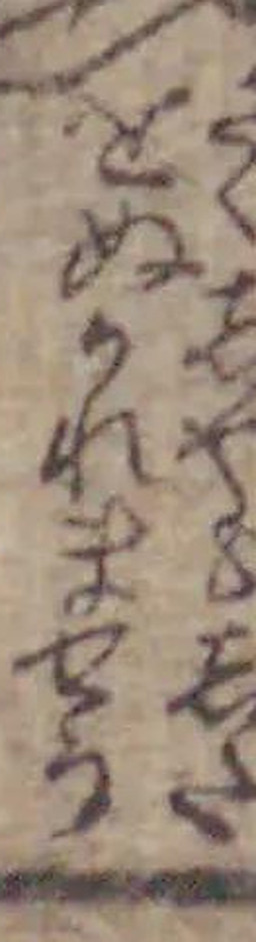をぬかれませう
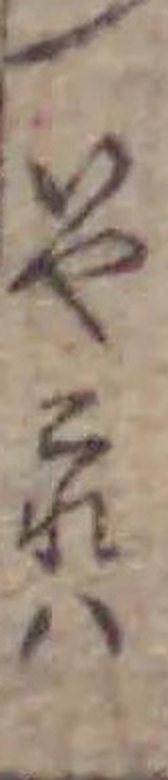いやこれは
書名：虚言弥二郎傾城誠 3巻
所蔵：国立国会図書館 National Diet Library, JAPAN
